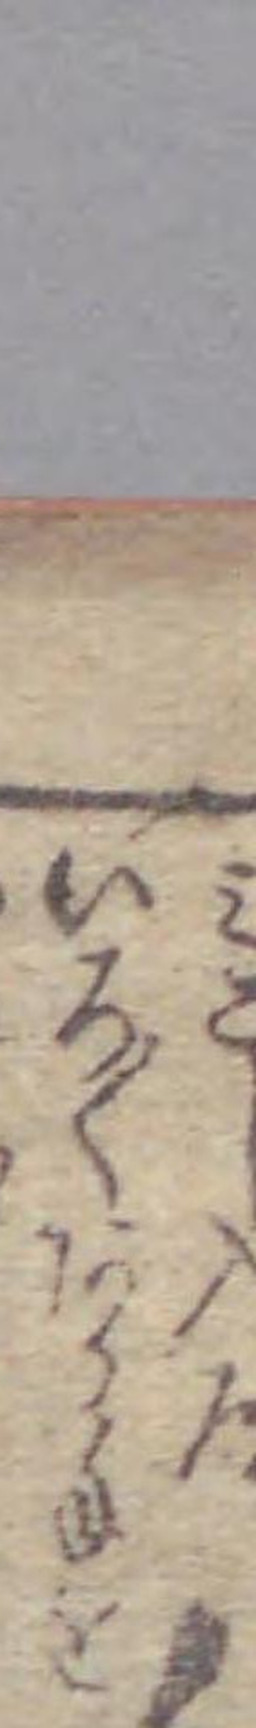いろ〳〵あら手を
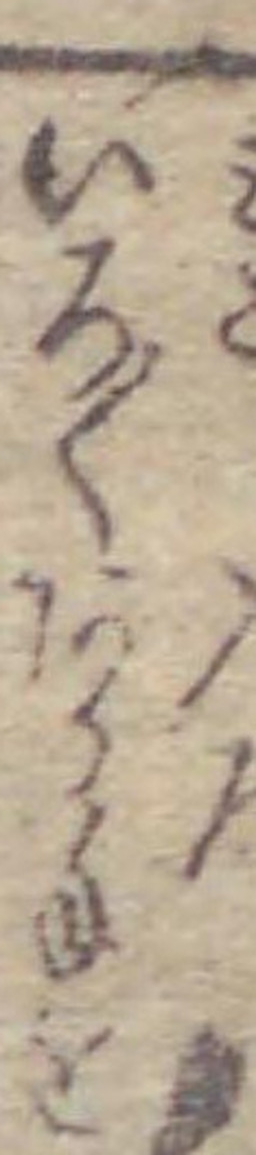いろ〳〵あら手を
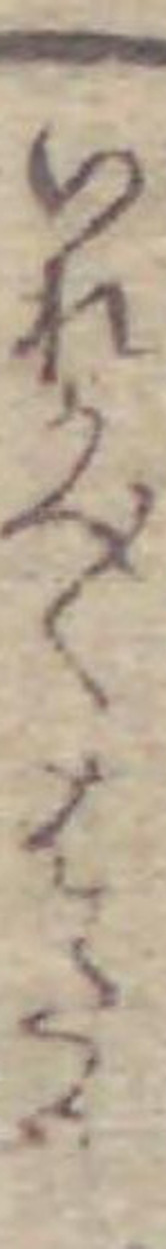いれかへ〳〵はたら
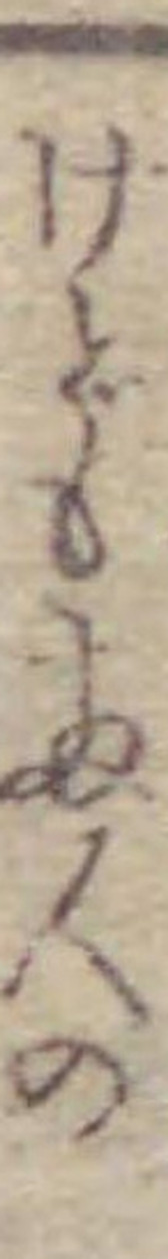けども両人の
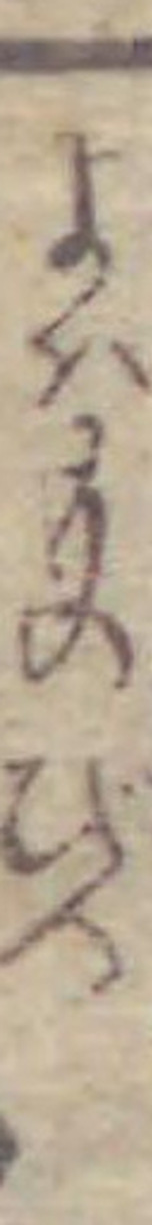よはものびつ
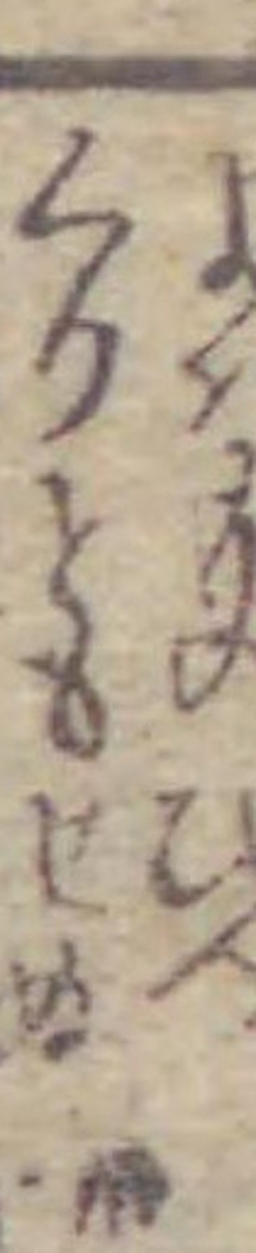くりともせぬ
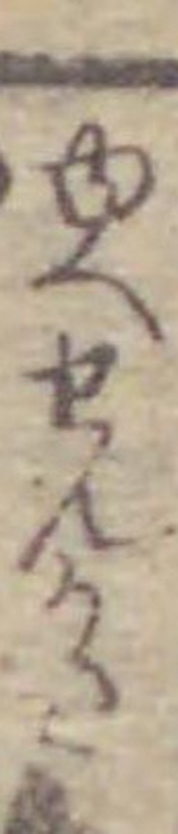ゆへせんかた
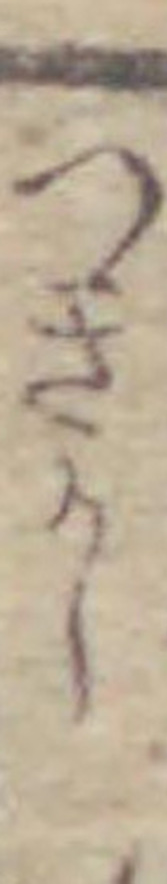つきかし
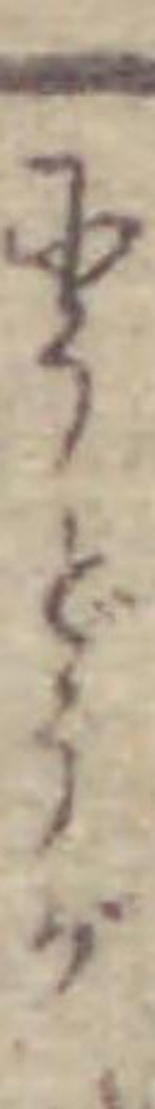にうどうが
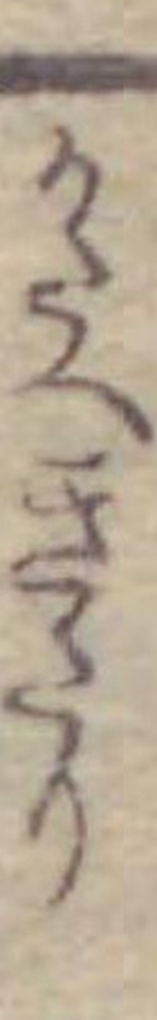かたへきたり
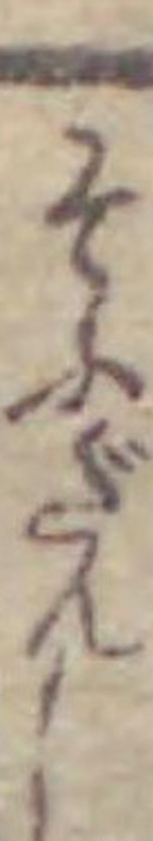そふだん
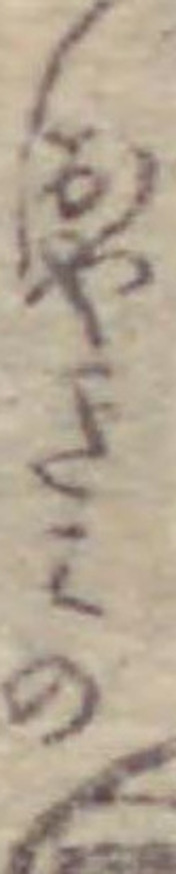おやきみの
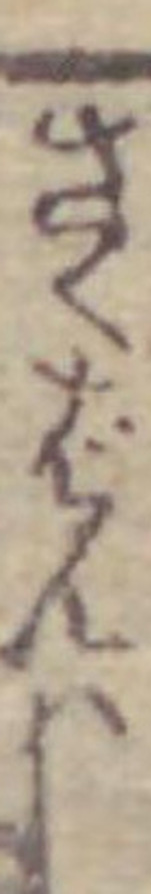さくばんは
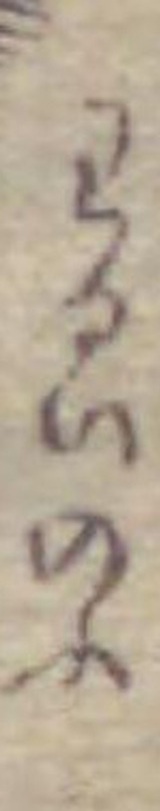わるいのふ
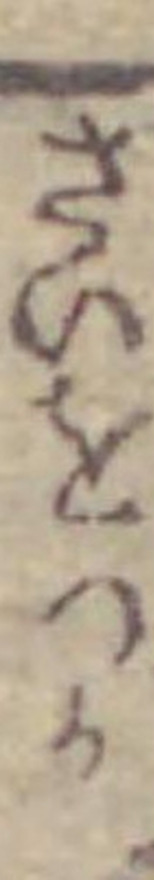さいをつか
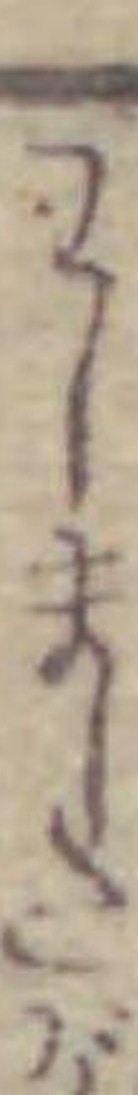わしましたが
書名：二日替 : 2巻
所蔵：国立国会図書館 National Diet Library, JAPAN
